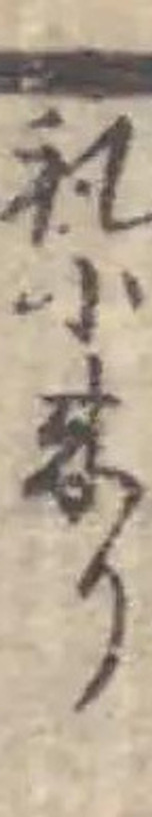礼に来り
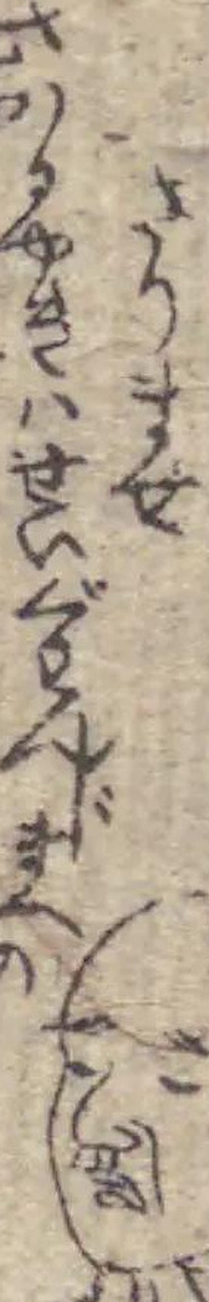此かるやきはせいぐわんじまへの
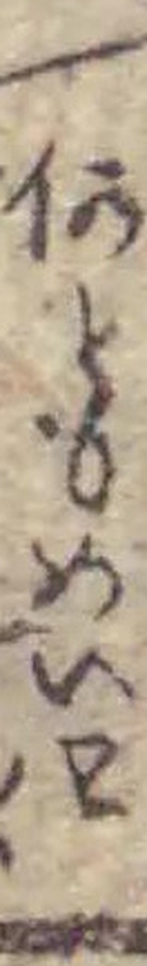何ともめいわ
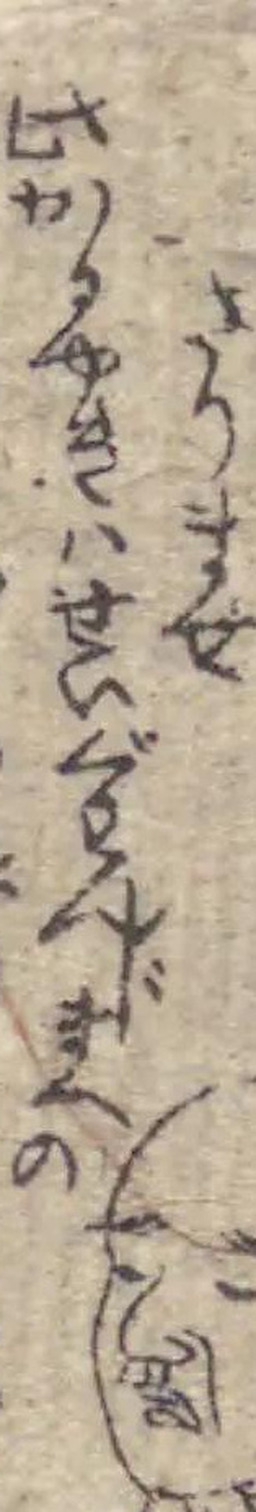此かるやきはせいぐわんじまへの
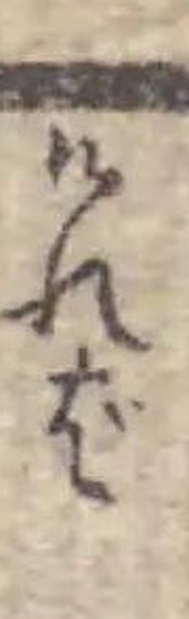ければ
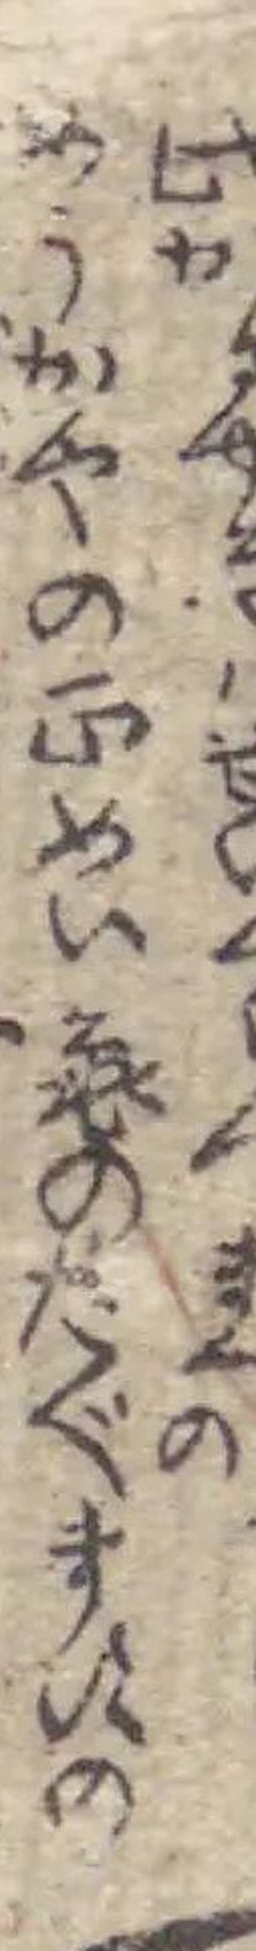めうかやの正めい亀のたべますの
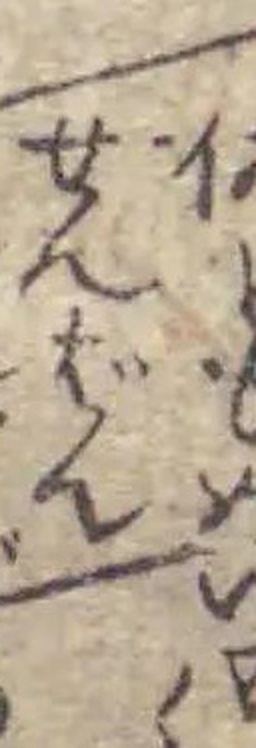せんばん
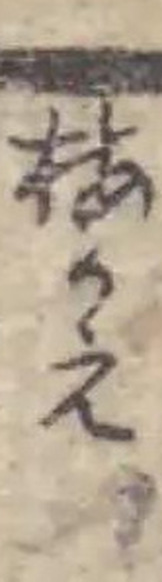梅かえ
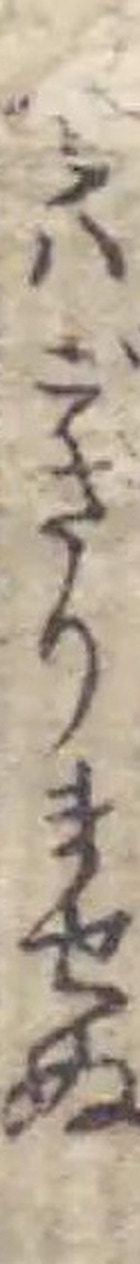ではござりませぬ
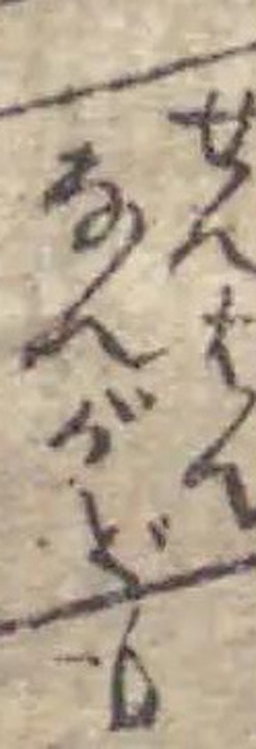なんがども
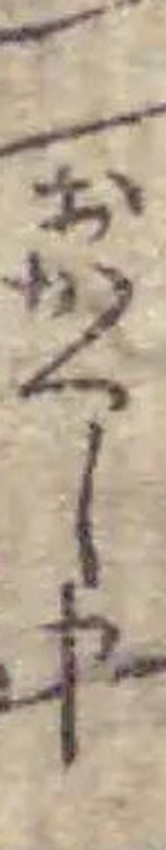おかへし申
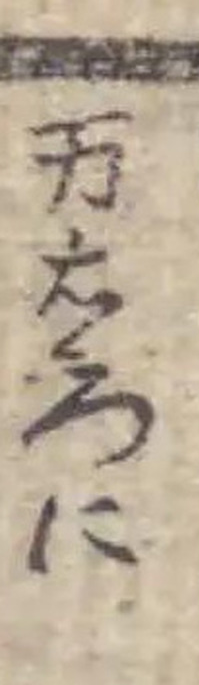万右衛門に
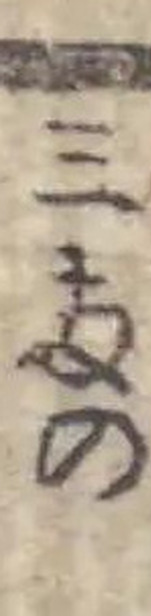三両の
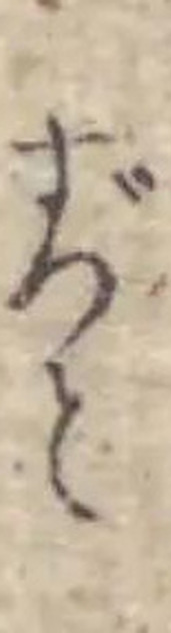ずつと
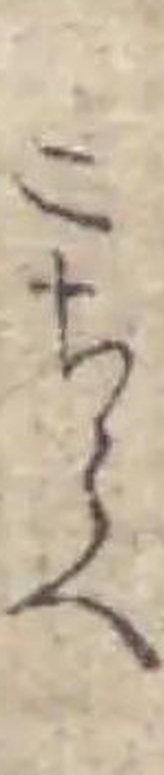こちらへ
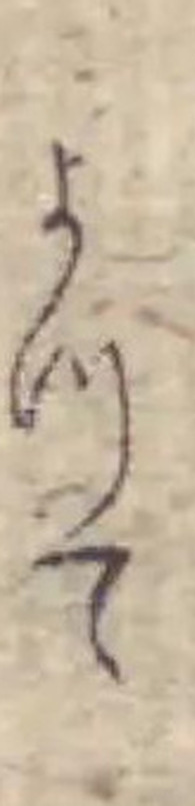よつて
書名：見立蓬莱 : 2巻
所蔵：国立国会図書館 National Diet Library, JAPAN
